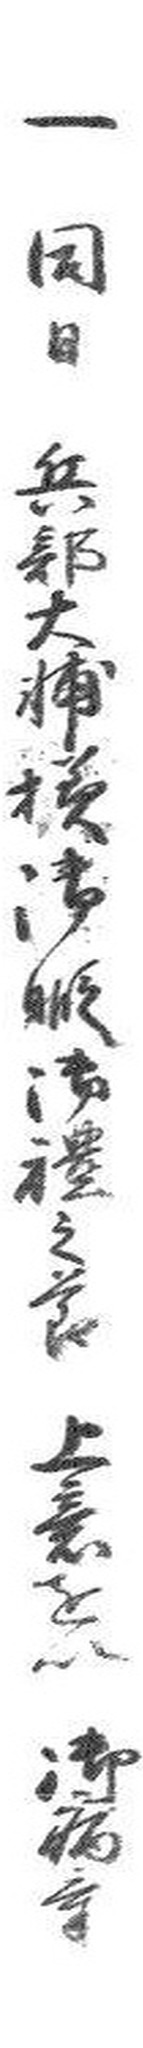一同日兵部大輔様御暇御礼之節上意を以御病気
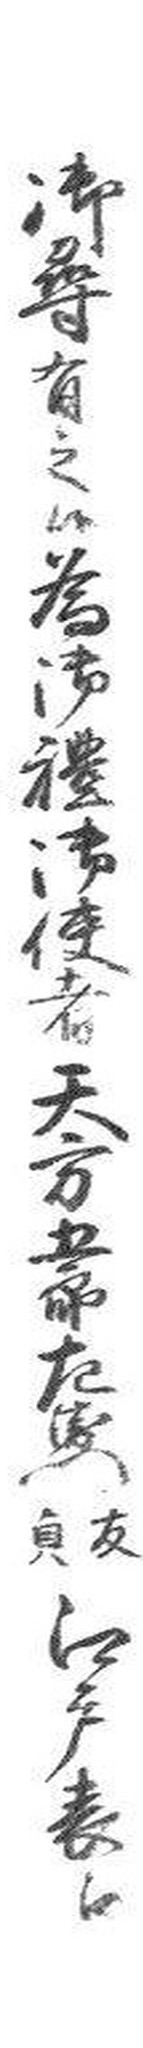御尋有之候為御礼御使者天方五郎左衛門友貞江戸表江
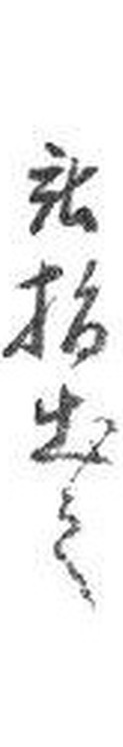被指出之
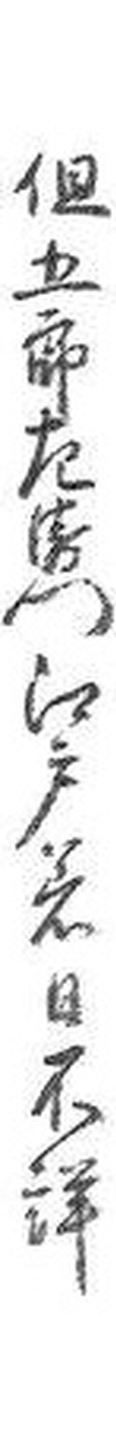但五郎左衛門江戸着日不詳
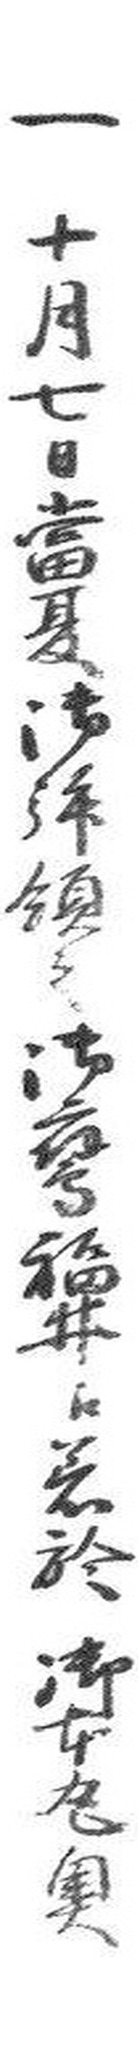一十月七日当夏御拝領之御鷹福井江着於御本丸奥
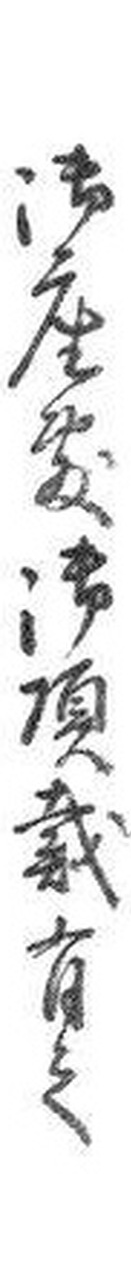御座敷御頂戴有之
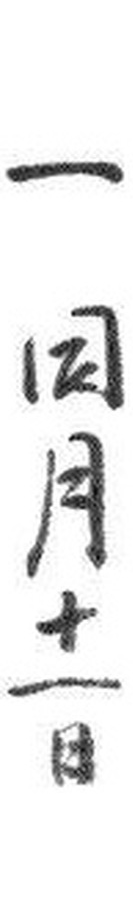一同月十一日
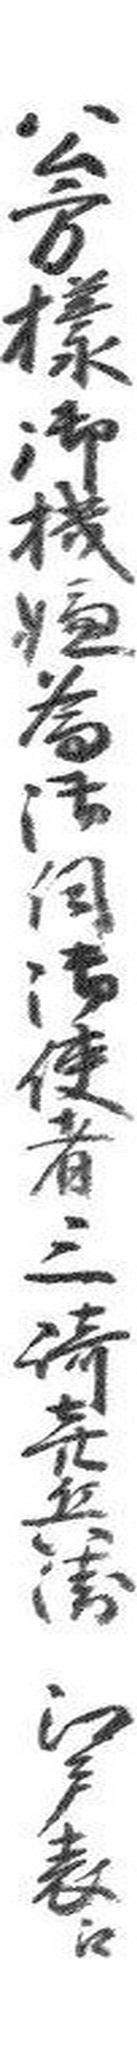公方様御機嫌為御伺御使者三崎喜兵衛江戸表江
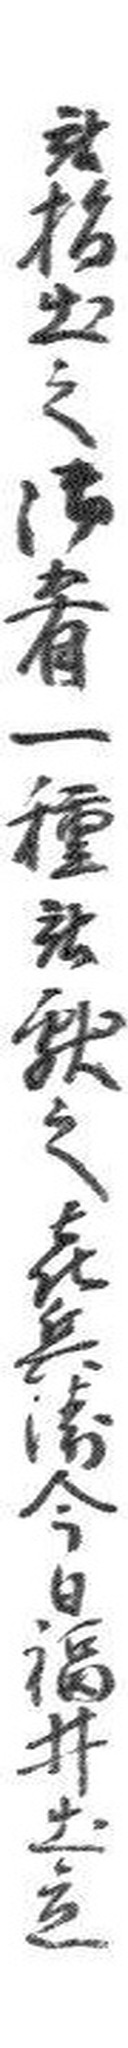被指出之御肴一種被献之喜兵衛今日福井出立
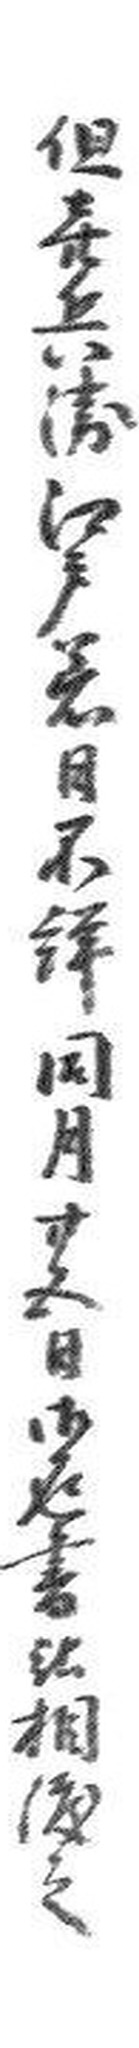但喜兵衛江戸着日不詳同月廿五日御返書被相渡之
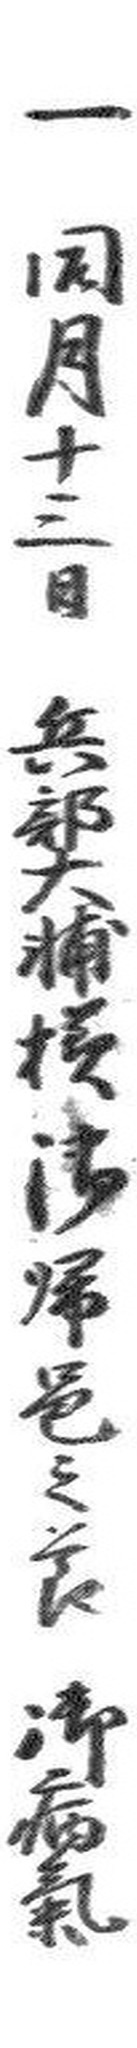一同月十三日兵部大輔様御帰邑之節御病気
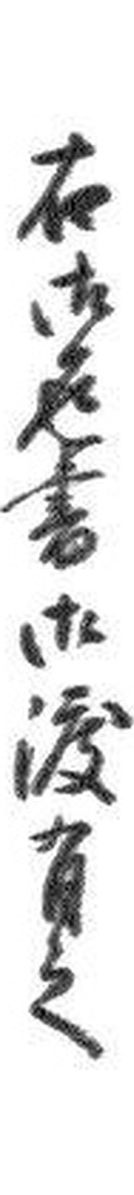右御返書御渡有之
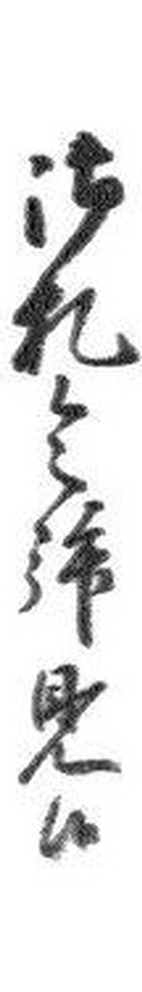御札令拝見候
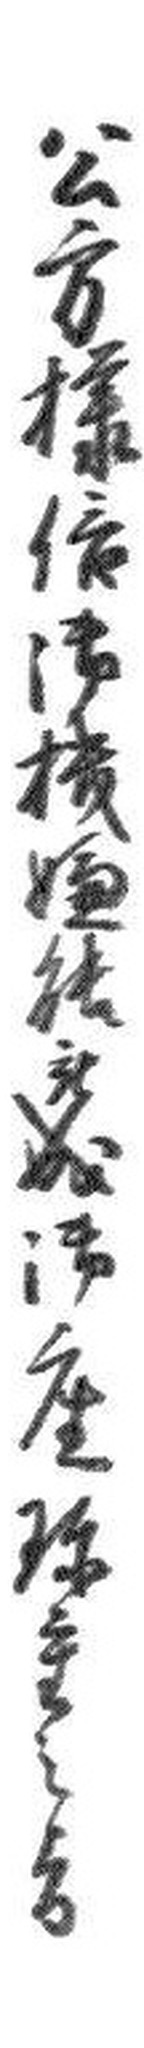公方様倍御機嫌能被成御座珎重候旨
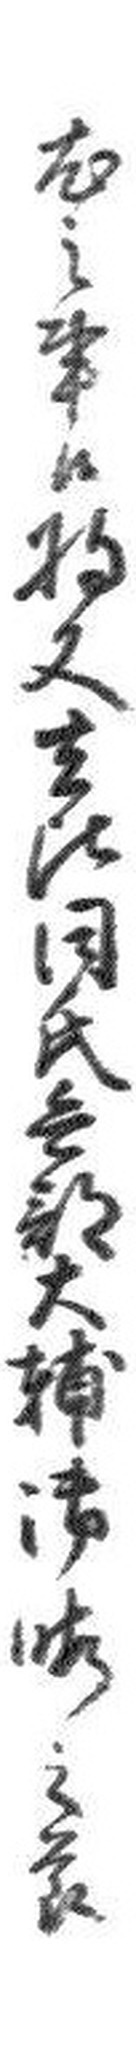尤之事候将又去頃同氏兵部大輔御暇之節
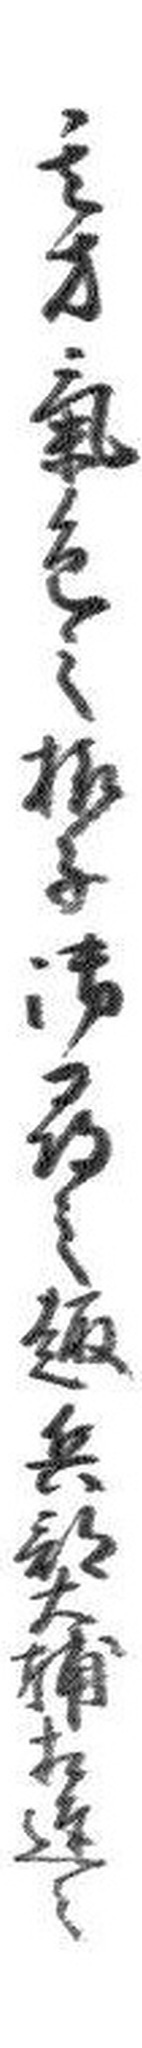其方気色之様子御尋之趣兵部大輔相達之
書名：家譜 八 光通公 従寛文十年到同十二年
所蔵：福井県文書館 Fukui Prefectural Archives
